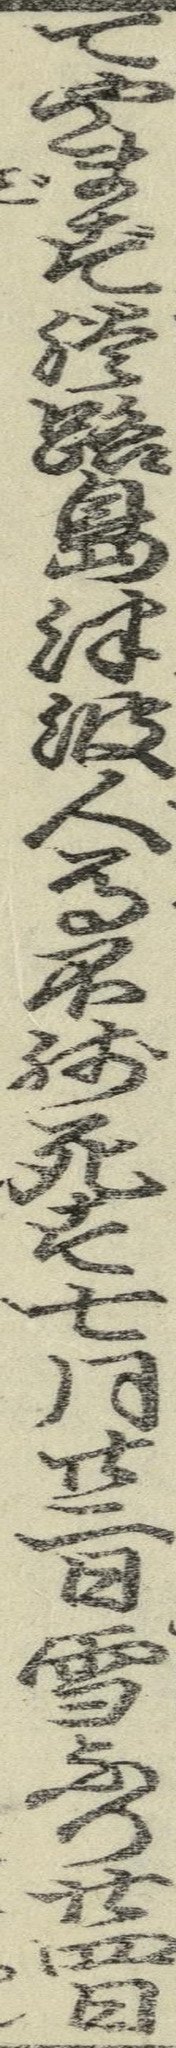てやまず淡路島津波人馬不残死す七月廿二日雪ふり廿四日
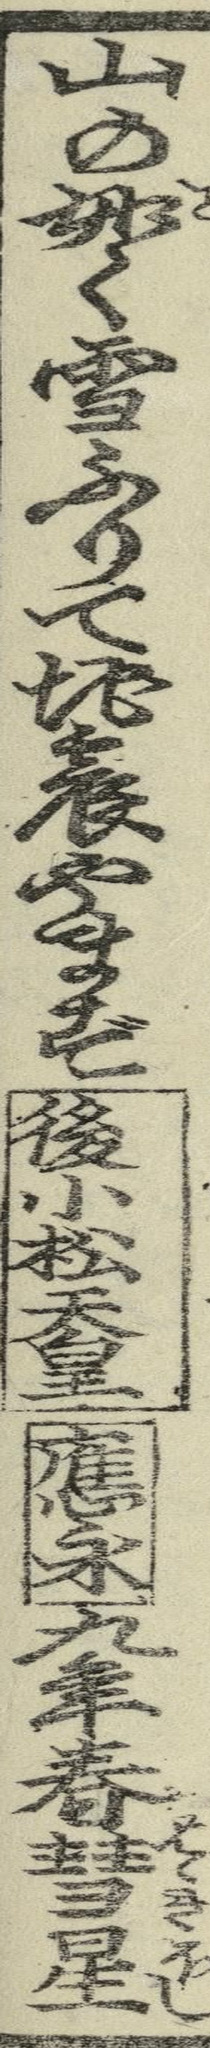山の如く雪ふりて地震やまず後小松天皇應永九年春彗星
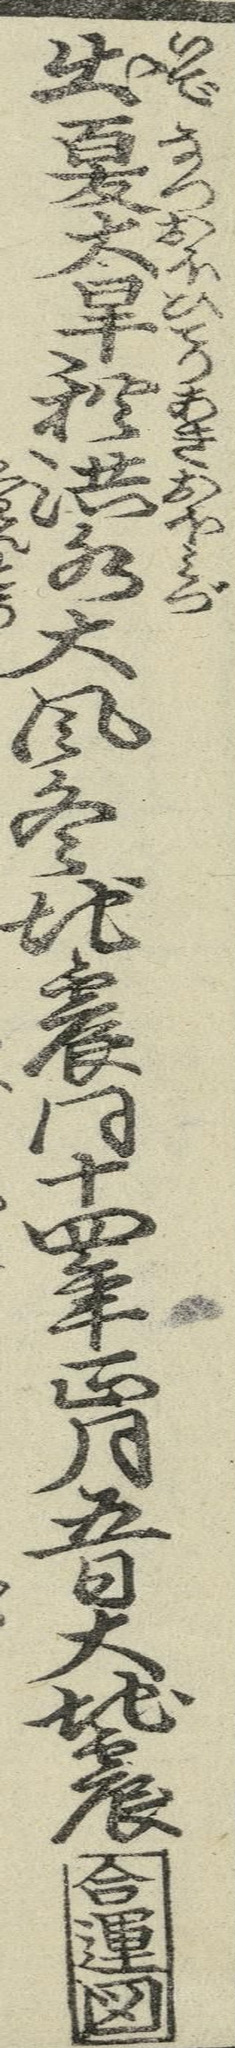出夏大旱秋洪水大風冬地震同十四年正月五日大地震合運図
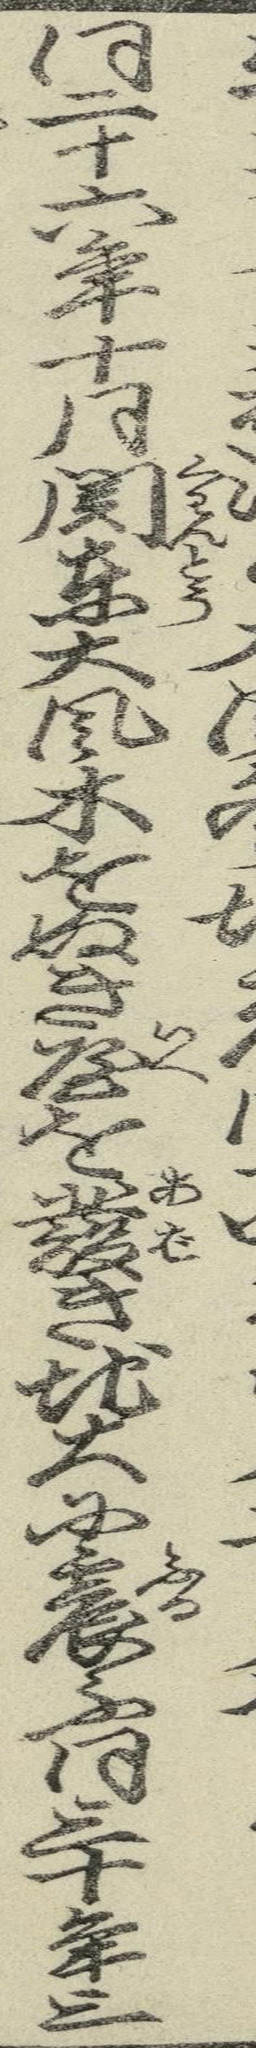同二十六年十月関東大風木をぬき屋を発き地大に震ふ同三十年三
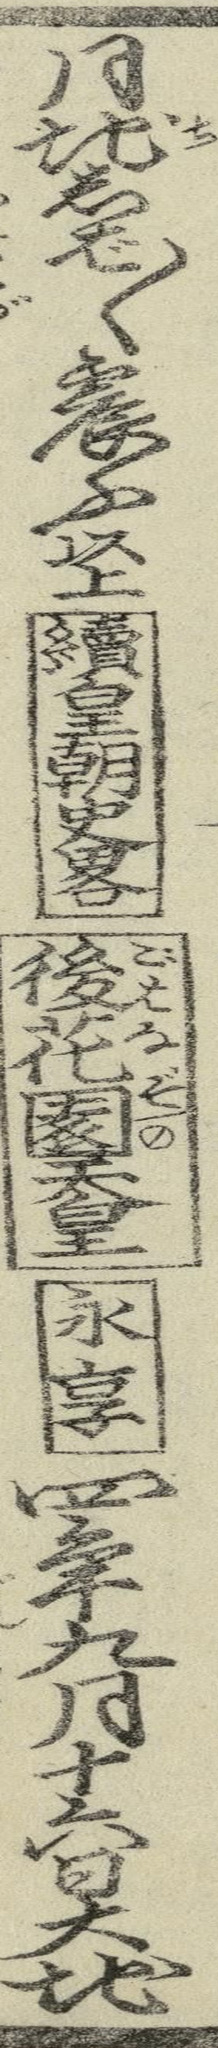月地しば〳〵震ふ以上続皇朝史略後花園天皇永享四年九月十六日大地
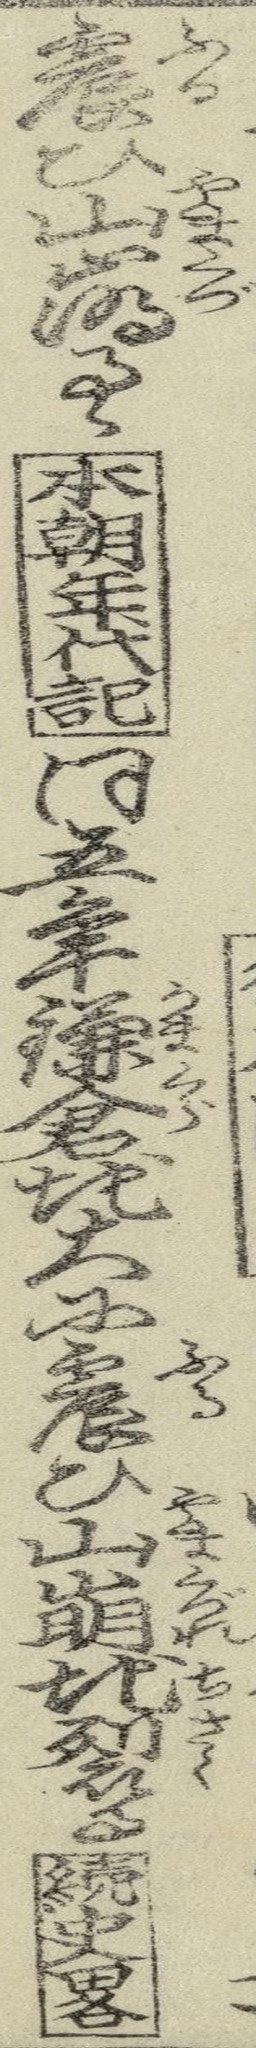震ひ山崩るゝ本朝年代記同五年鎌倉地大に震ひ山崩地裂る続史略
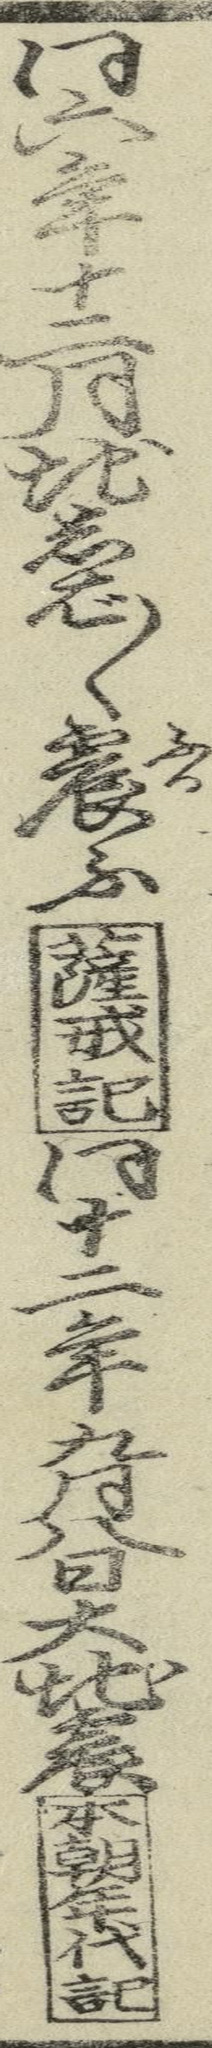同六年十二月地しば〳〵震ふ薩戒記同十二年九月八日大地震本朝年代記
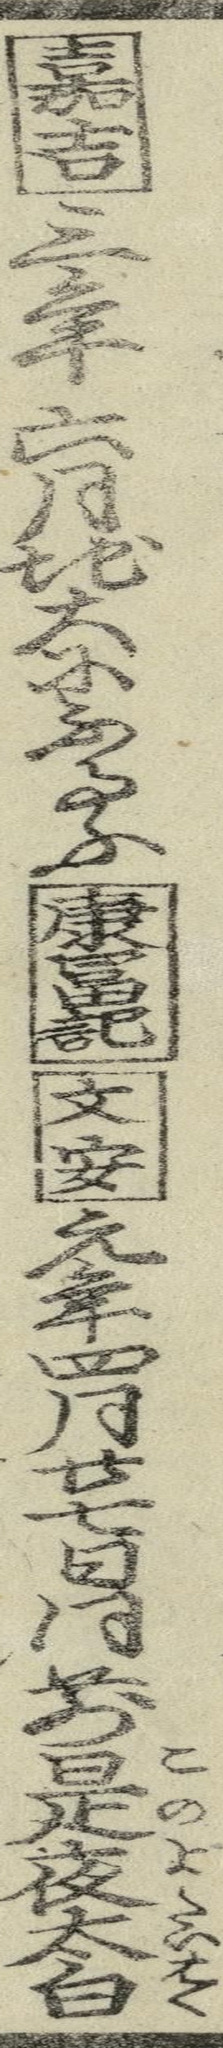嘉吉三年六月地大にふるふ康富記文安元年四月廿七日同前是夜太白
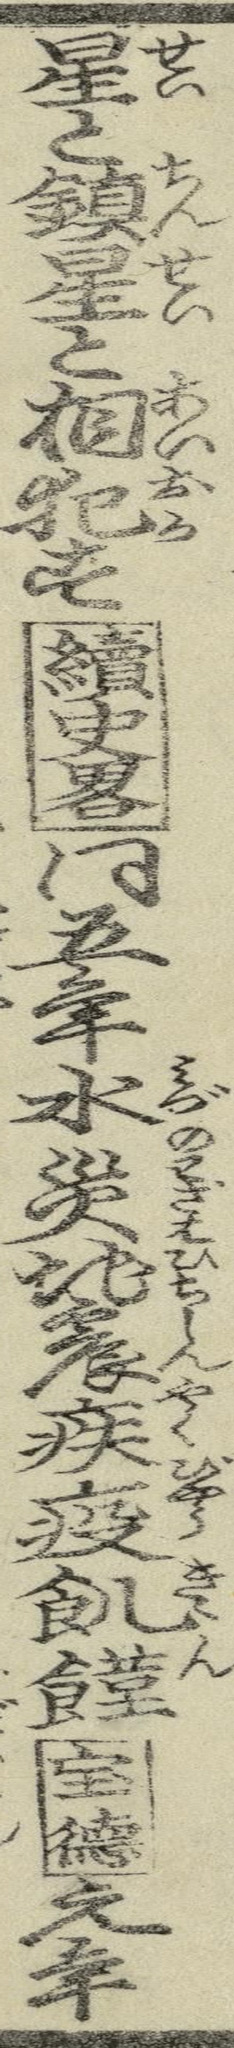星と鎮星と相犯す続史略同五年水災地震疾疫飢饉宝徳元年
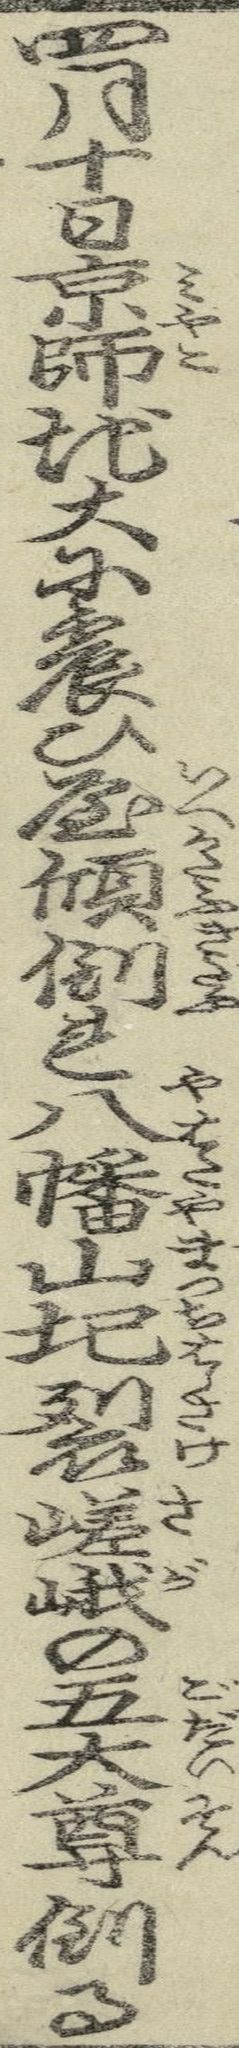四月十日京師地大に震ひ屋傾倒れ八幡山地裂嵯峨の五大尊倒る
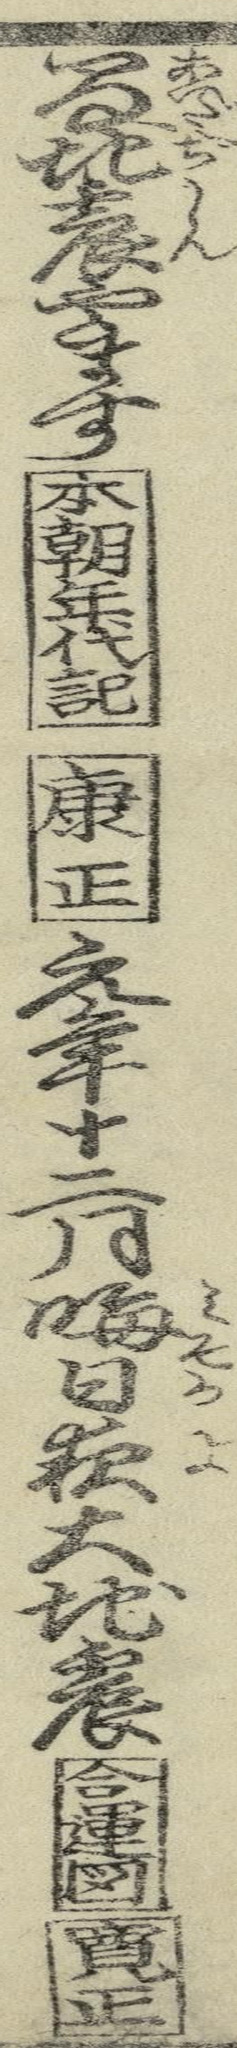間地震やます本朝年代記康正元年十二月晦日夜大地震合運図寛正
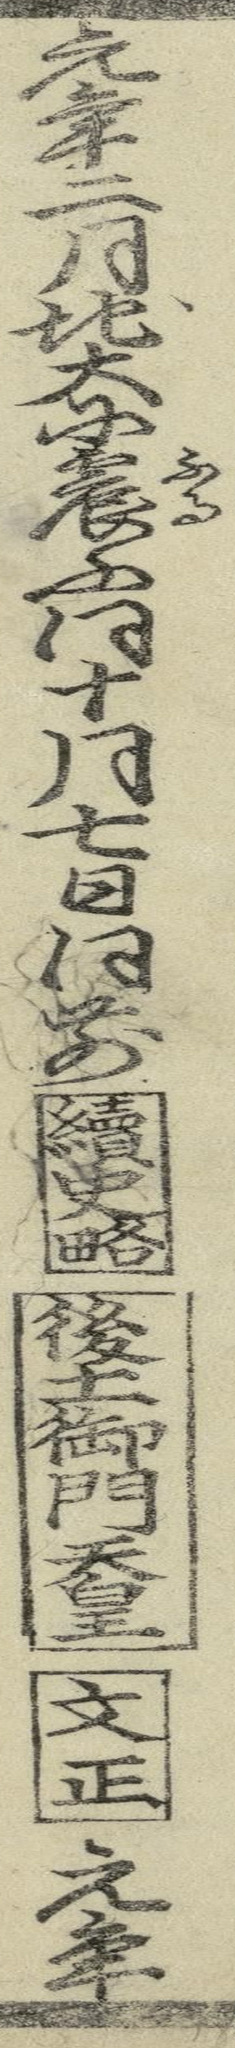元年二月地大に震ふ同十月七日同前続史略後土御門天皇文正元年

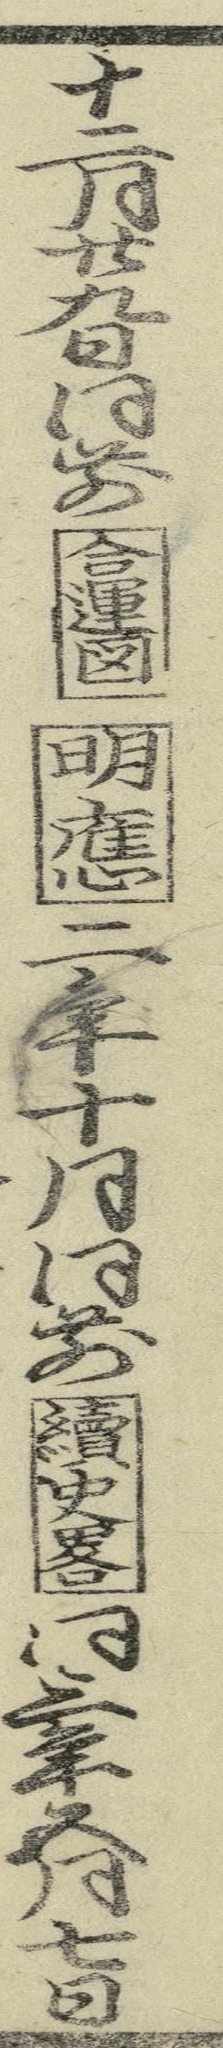十二月廿九日同前合運図明応二年十月同前続史略同三年五月七日
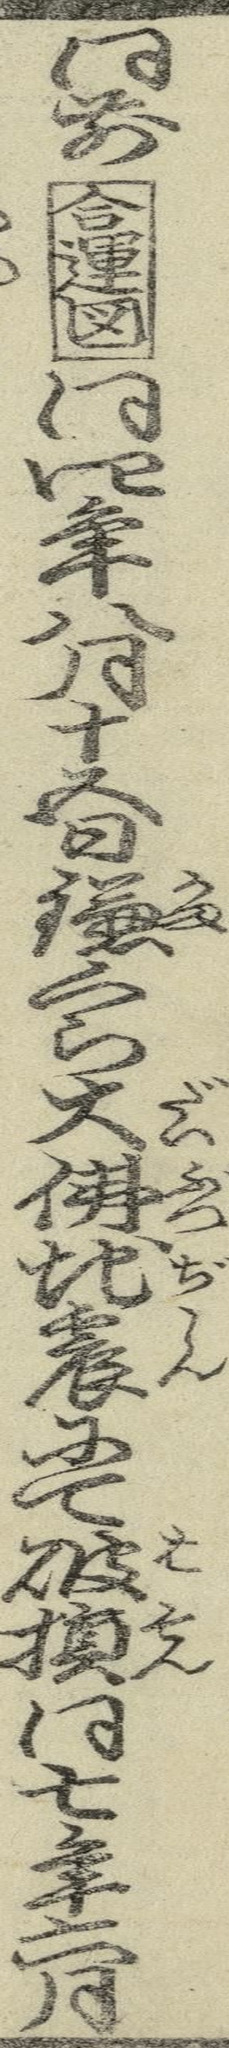同前合運図同四年八月十五日、鎌くら大佛地震にて破損同七年六月
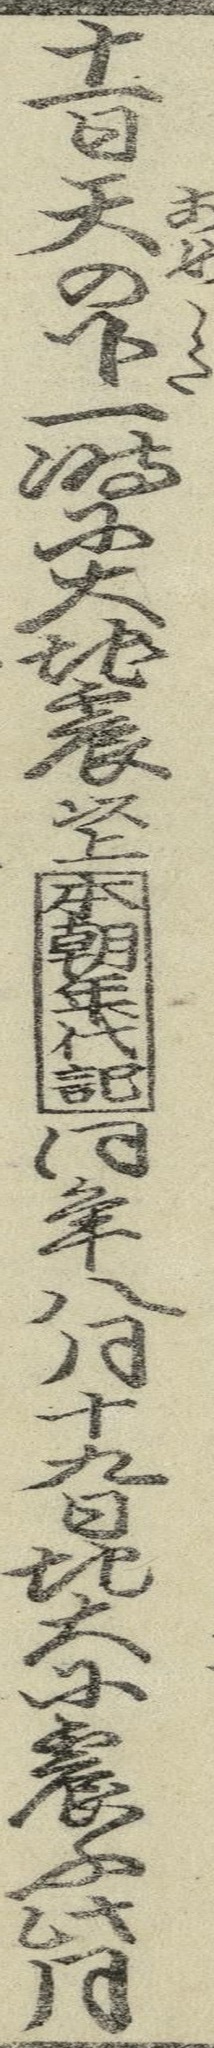十一日天の下一時に大地震以上本朝年代記同年八月十九日地大に震ふ此月
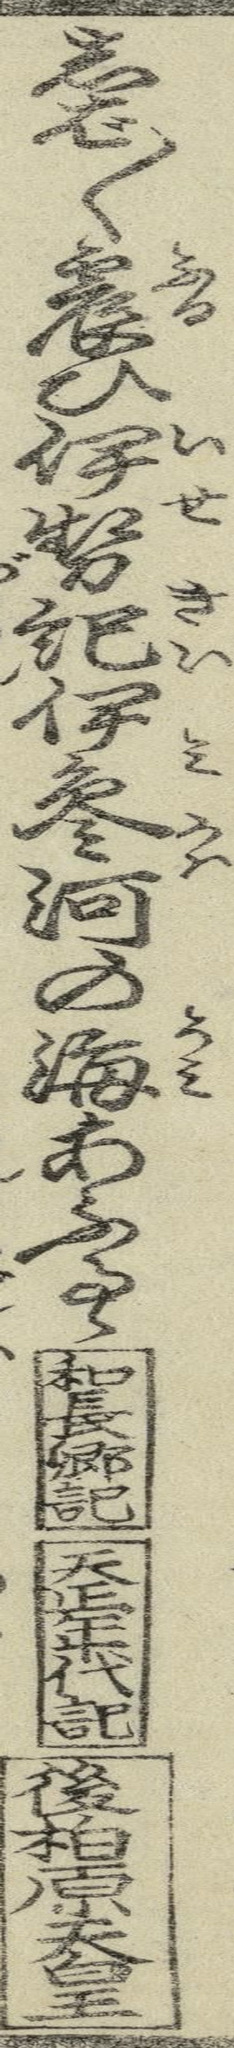しば〳〵震ひ伊勢紀伊参河の海あふるゝ和長郷記天正年代記後柏原天皇
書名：地震年代記
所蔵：東京大学地震研究所図書室 Earthquake Research Institute Library, The University of Tokyo, JAPAN
